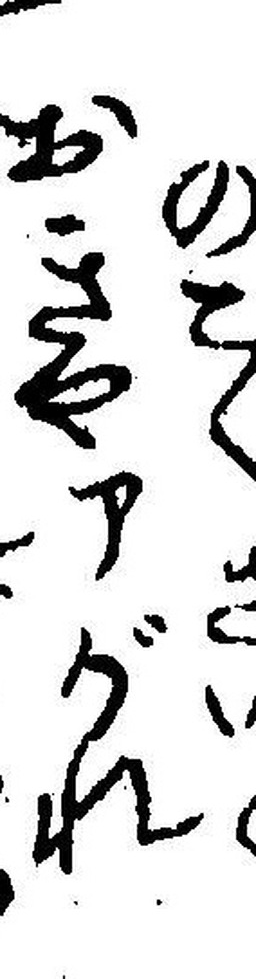おきやぁがれ
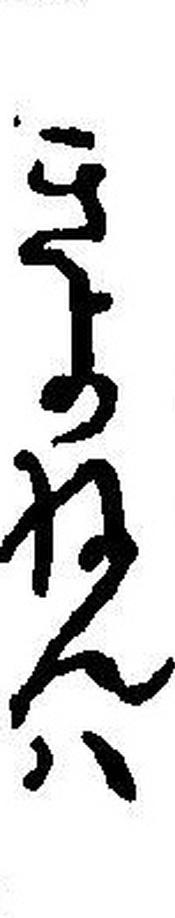きよねんは
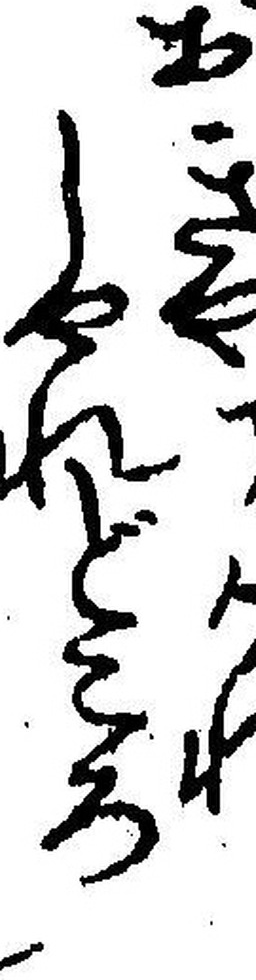しやれどころ
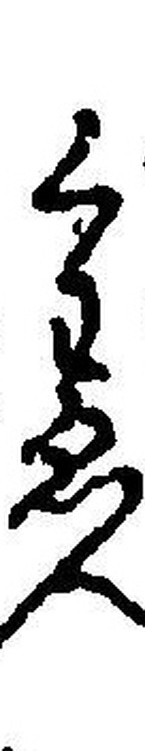くわゑん
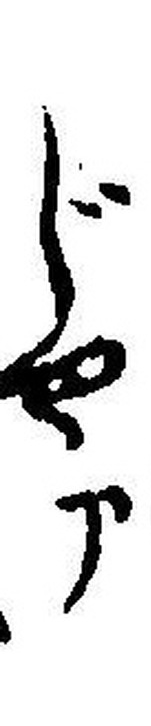じやァ
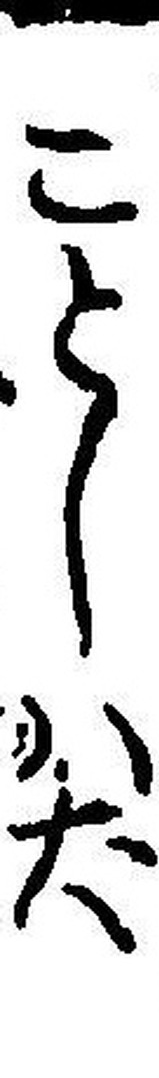ことしは犬
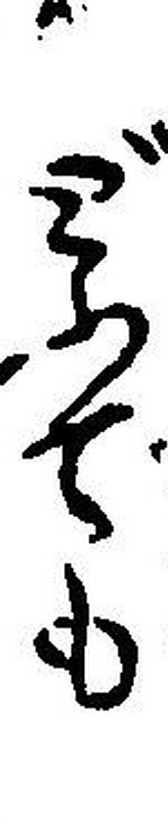どふても
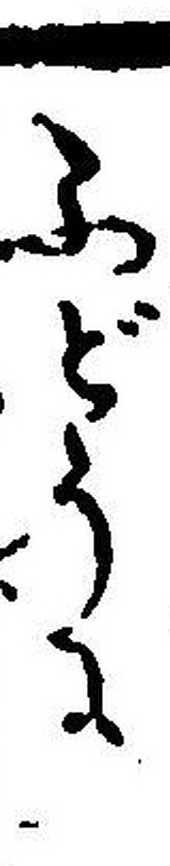ふどうに
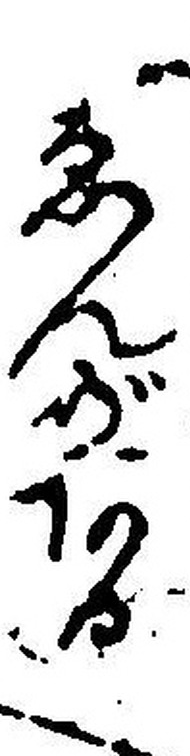ゑんがある

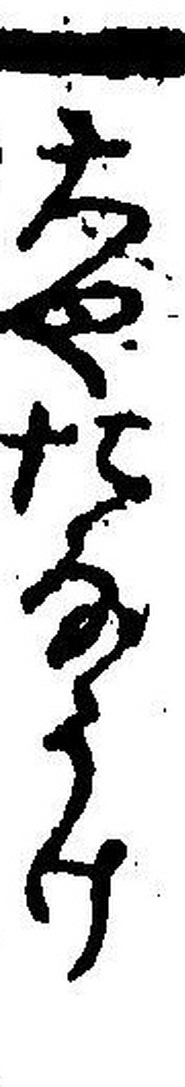大やたなうけ
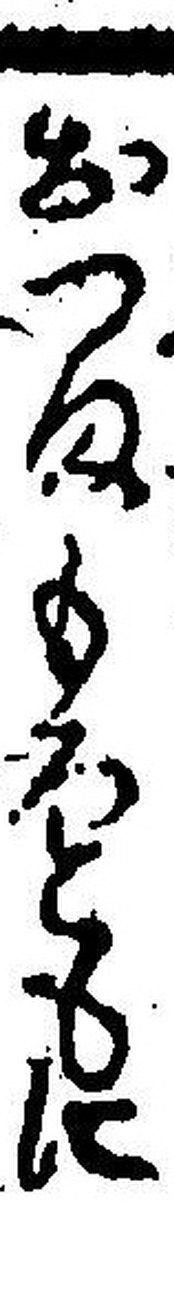おつまもろともに
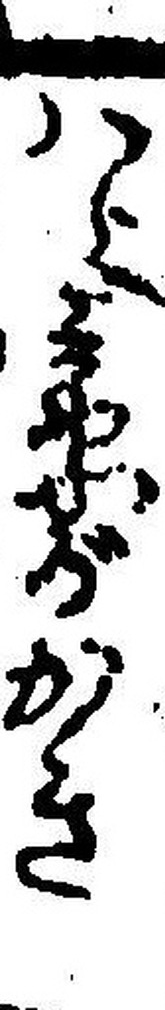八郎兵衛がかき
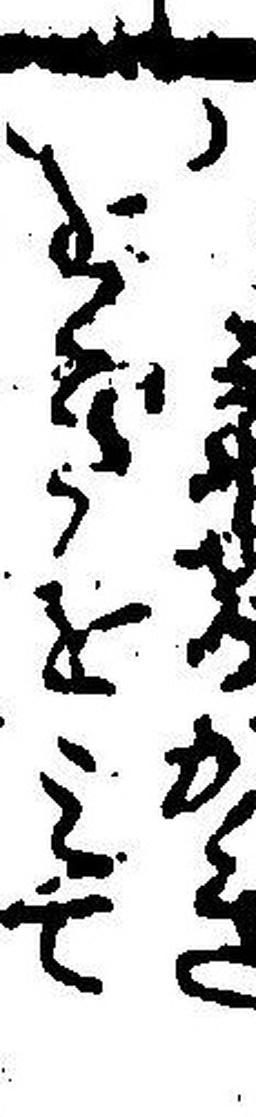をきをみて
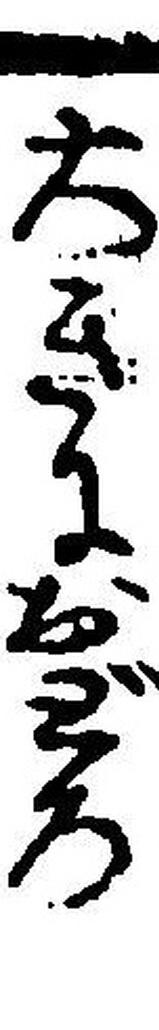大きにおどろ
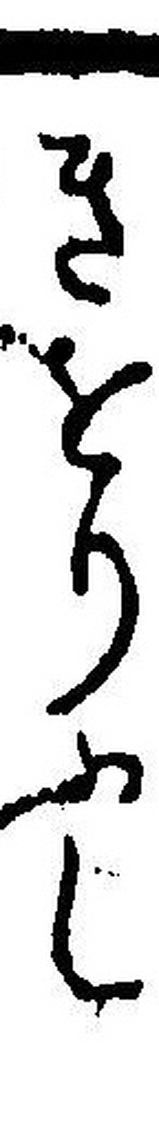きをりふし
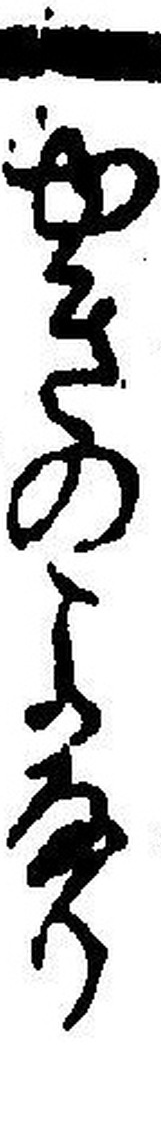ゆきのよなり
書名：花芳野犬斑 / 山東京伝作
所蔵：東京大学総合図書館 General Library in the University of Tokyo, JAPAN
